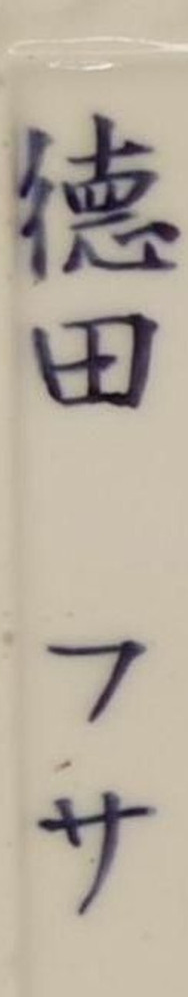徳田フサ

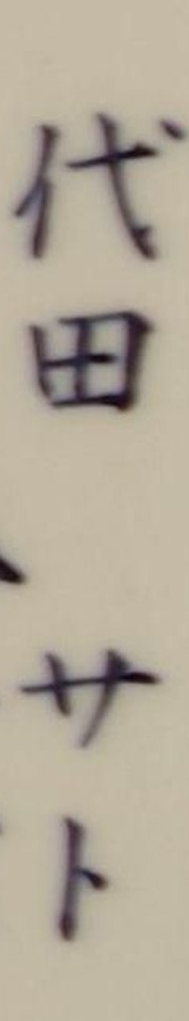代田サト
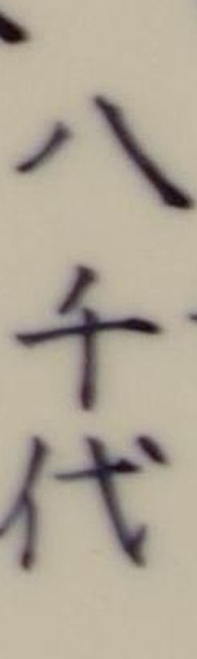八千代
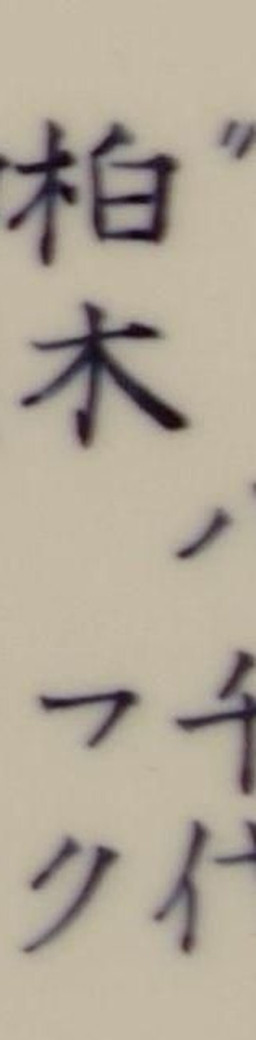柏木フク
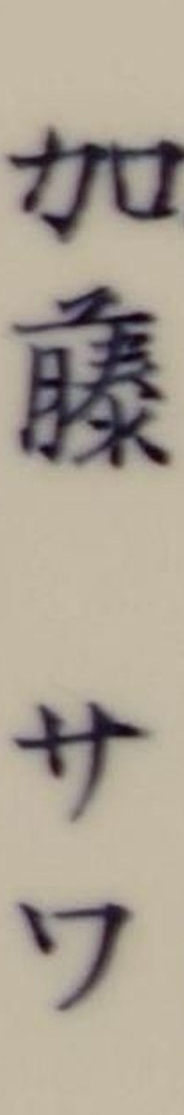加藤サワ
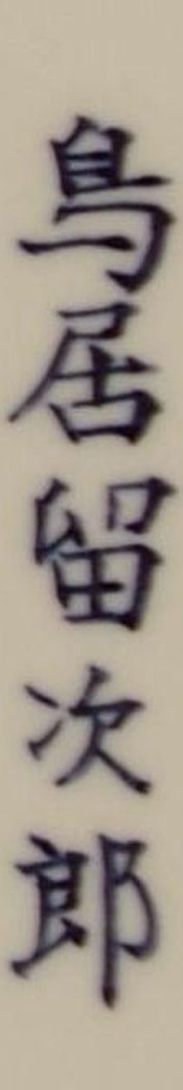鳥居留次郎
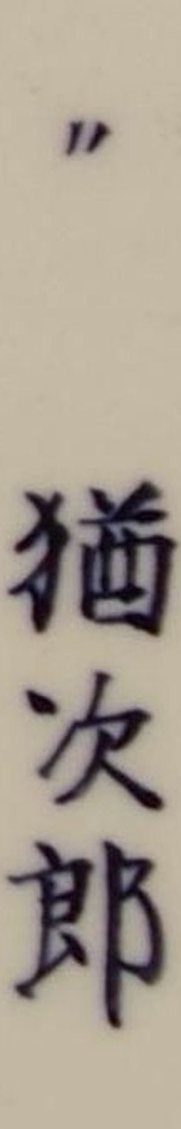猶次郎
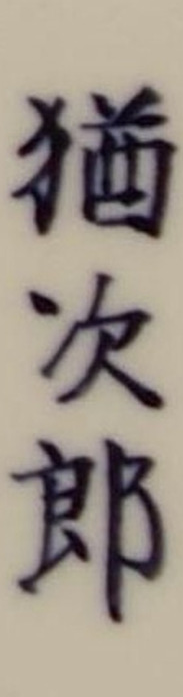猶次郎
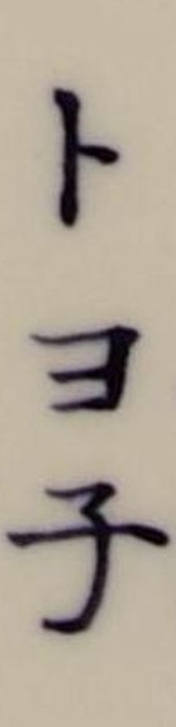トヨ子
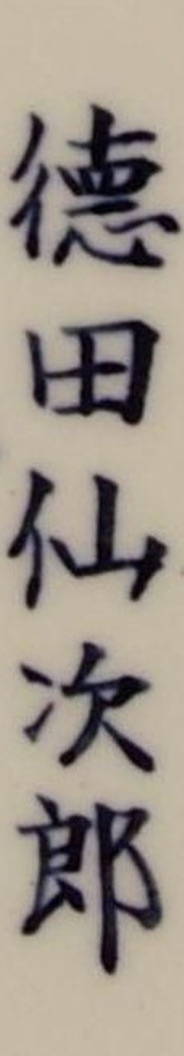徳田仙次郎
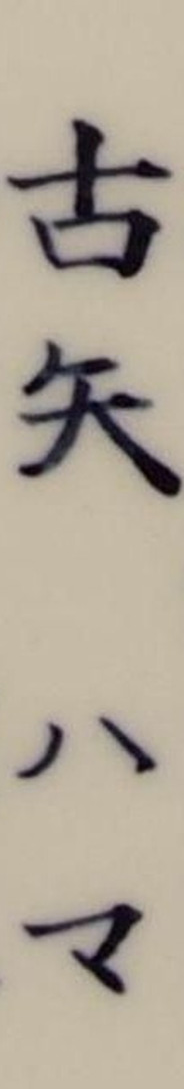古矢ハマ
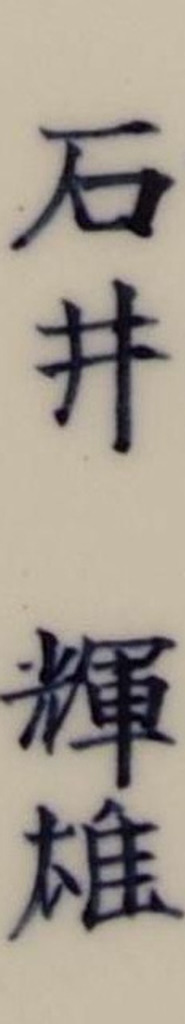石井輝雄
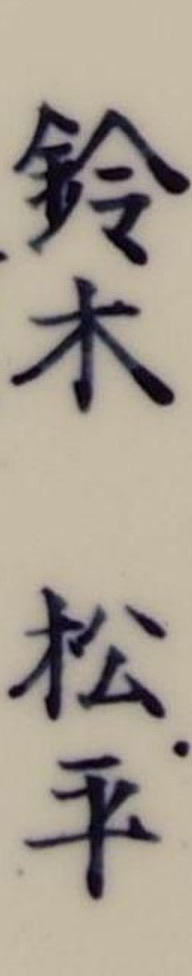鈴木松平
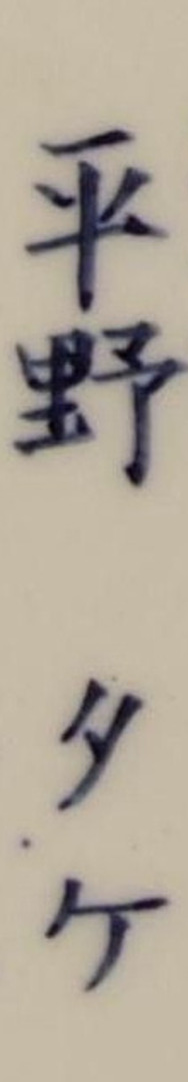平野夕ケ
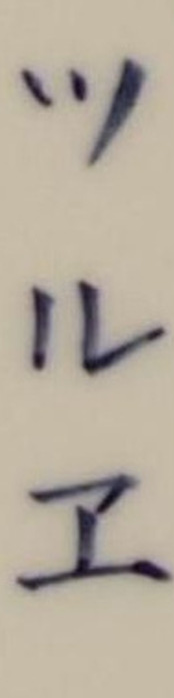ツルヱ
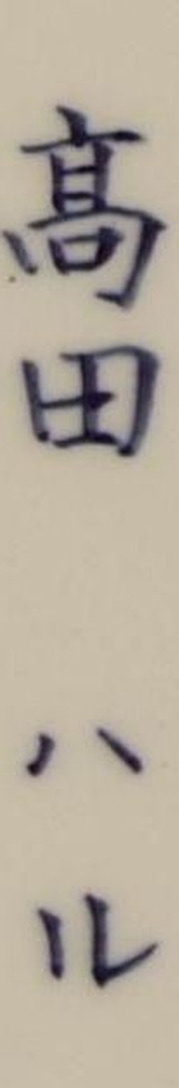高田ハル
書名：M~S
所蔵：高野山金剛峯寺
